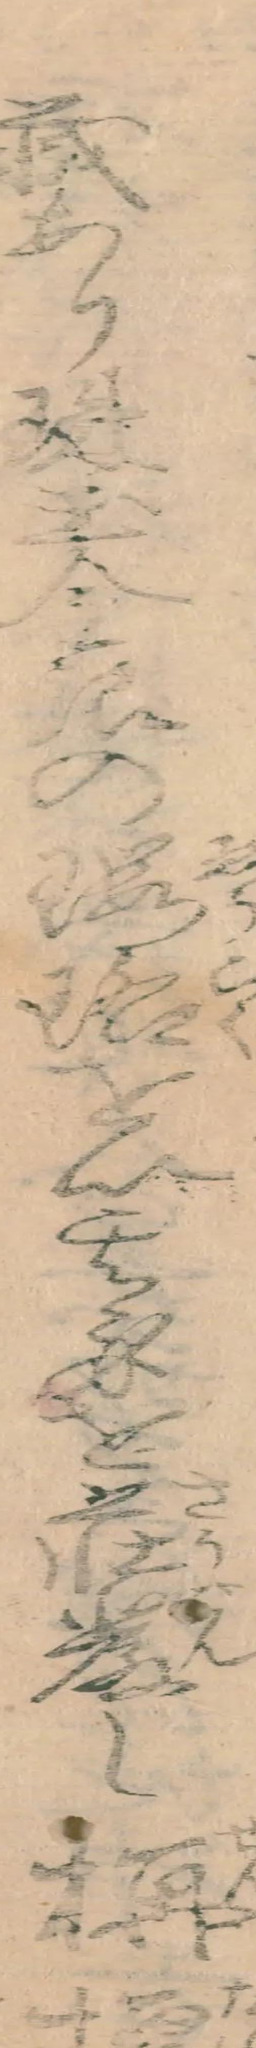蔵あり珠玉金銀の瓔珞を以其身を荘厳し栴檀
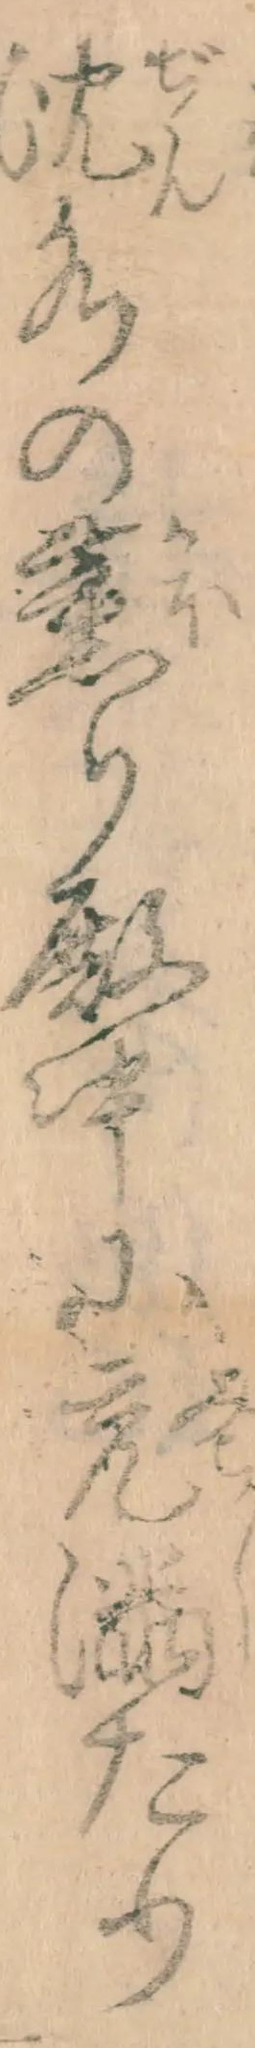沈水の薫り殿中に充満たり
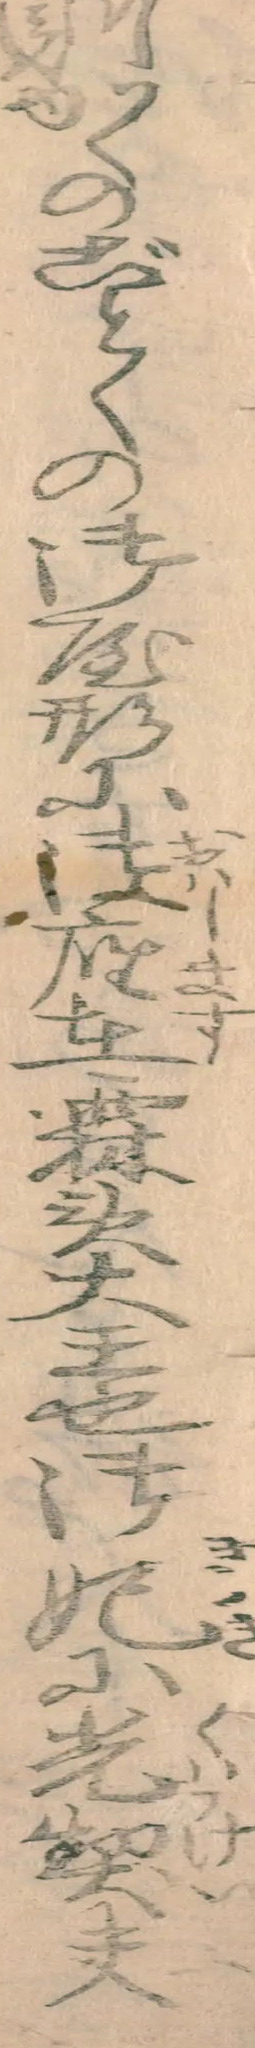則かくのごとくの御屋形に御座在霖夷大王也御妃に光契夫
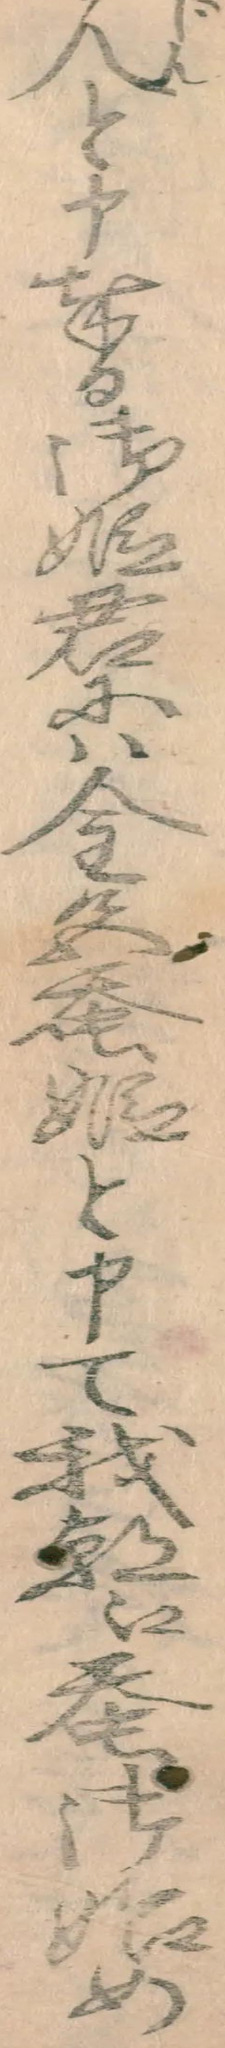人と申奉る御姫君には金色蚕姫と申て我朝え蚕御始め
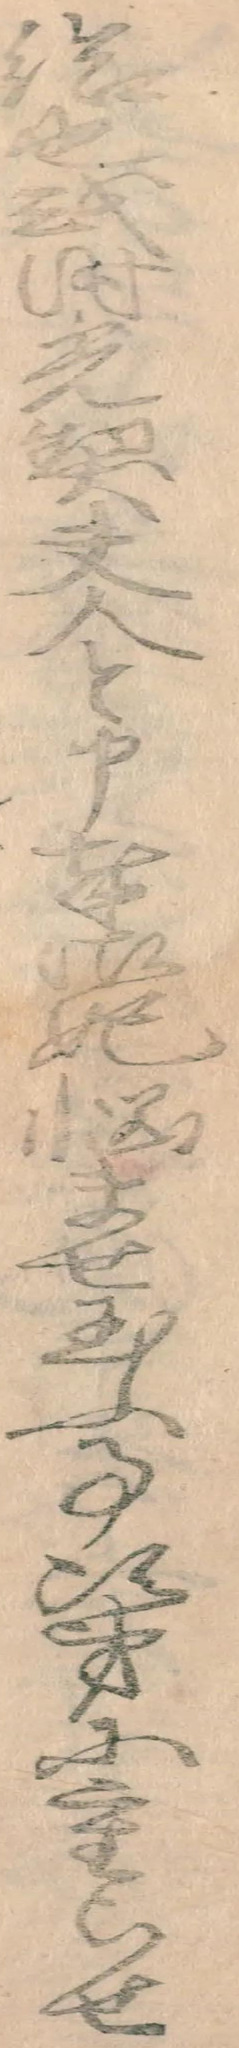給也或時光契夫人と申奉御妃悩ませ玉ふ事次第に重らせ
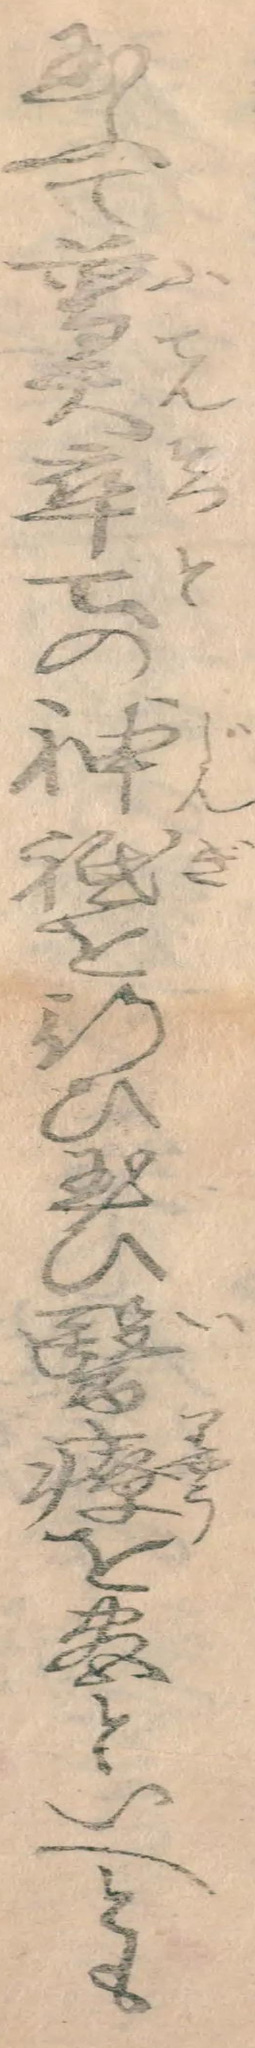玉ふて普天卒土の神祇を行ひ玉ひ医療を尽といへとも
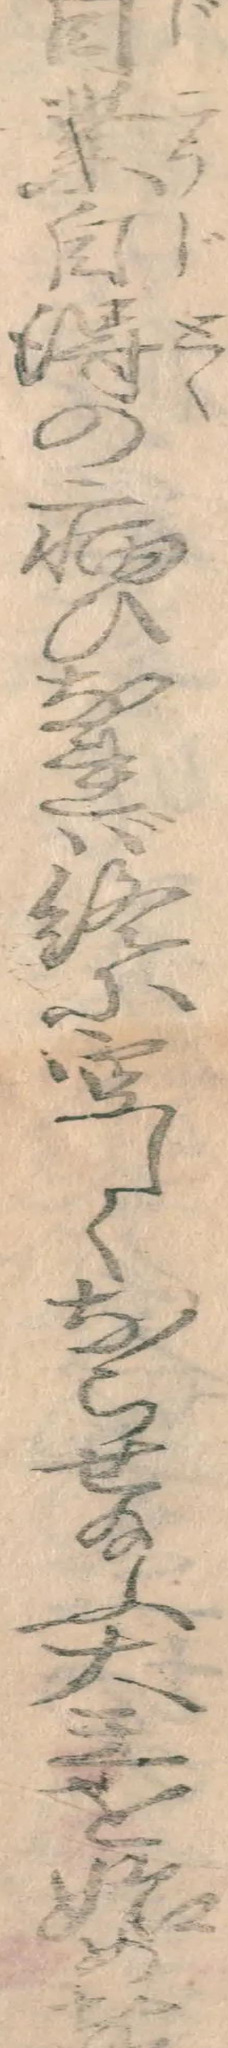自業自得の病ひなれば終に空しくならせ給ふ大王を始め奉り
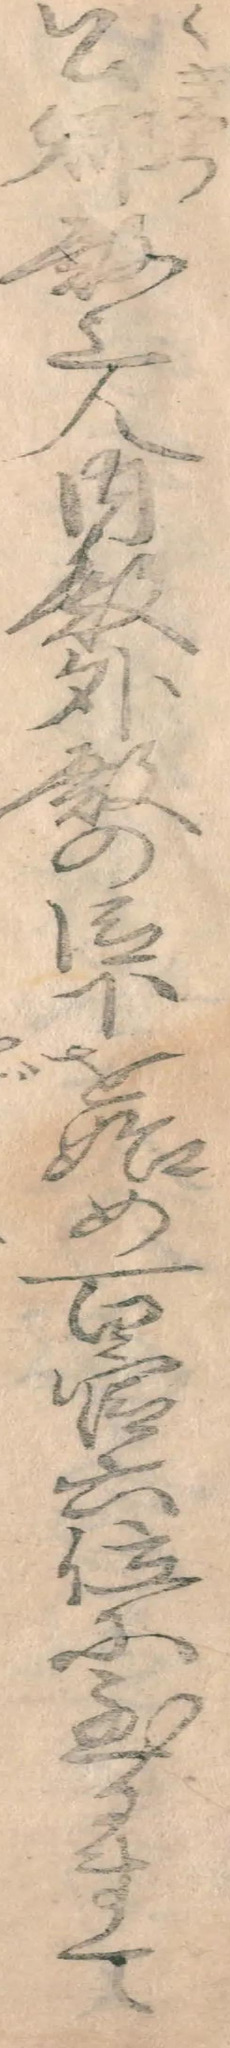公卿殿上人内殿外殿の臣下を始め百官六位に至るまて
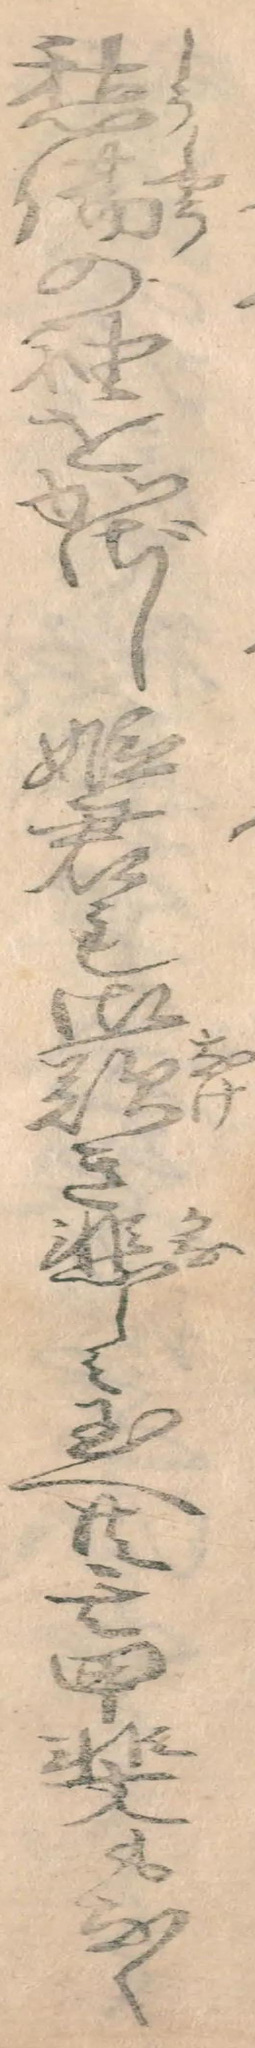愁傷の袖をかざし姫君も御歎き悲しみ玉へ共其甲斐もなく
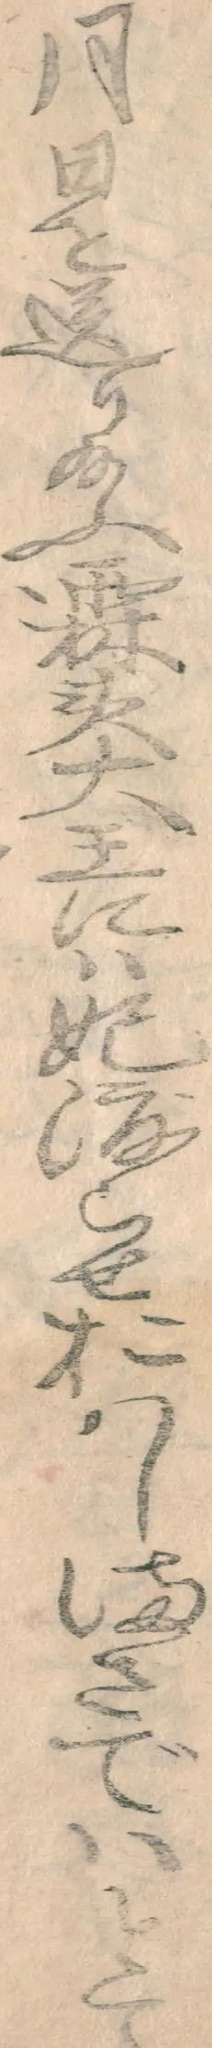月日を送り給ふ霖夷大王には妃渡らせおはしまさではとて
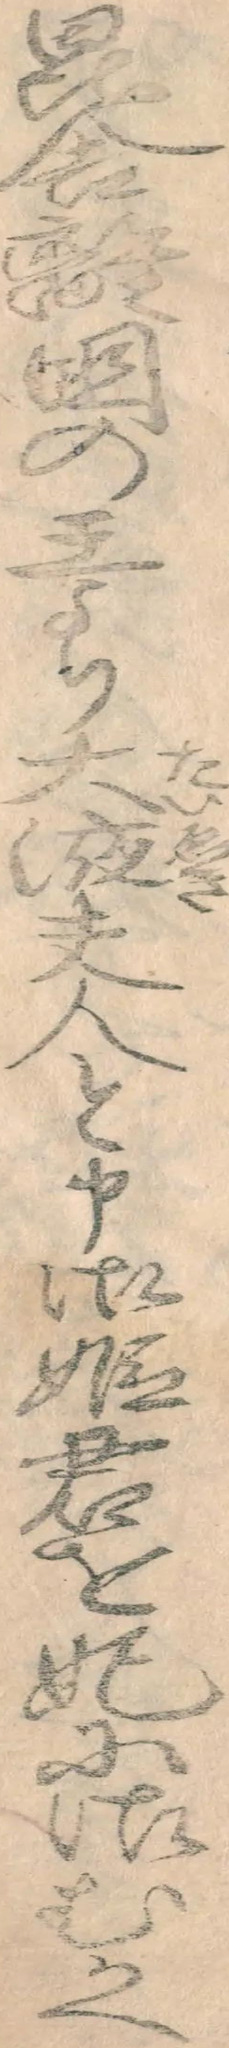毘舎離国の王より大液夫人と申御姫君を妃に御むかへ
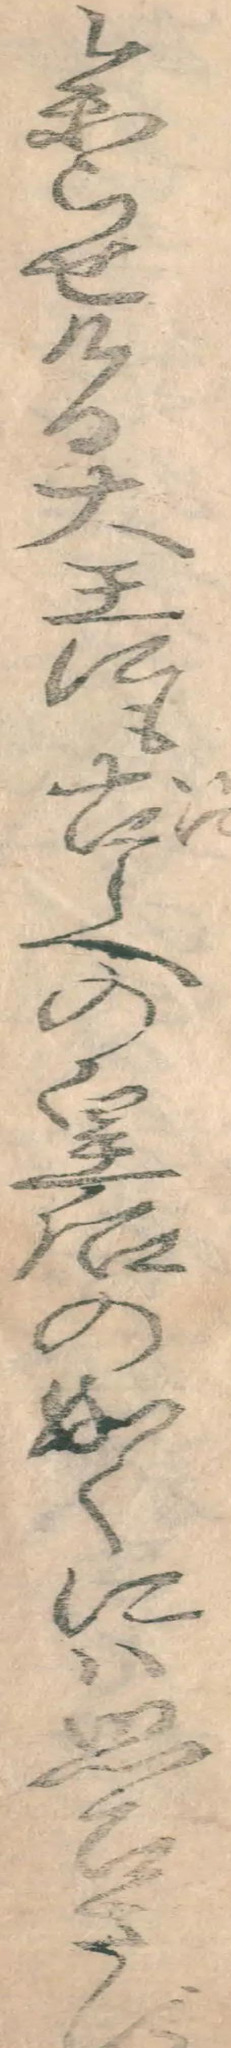参らせける大王にも古しへ皇后の如くには思召さず

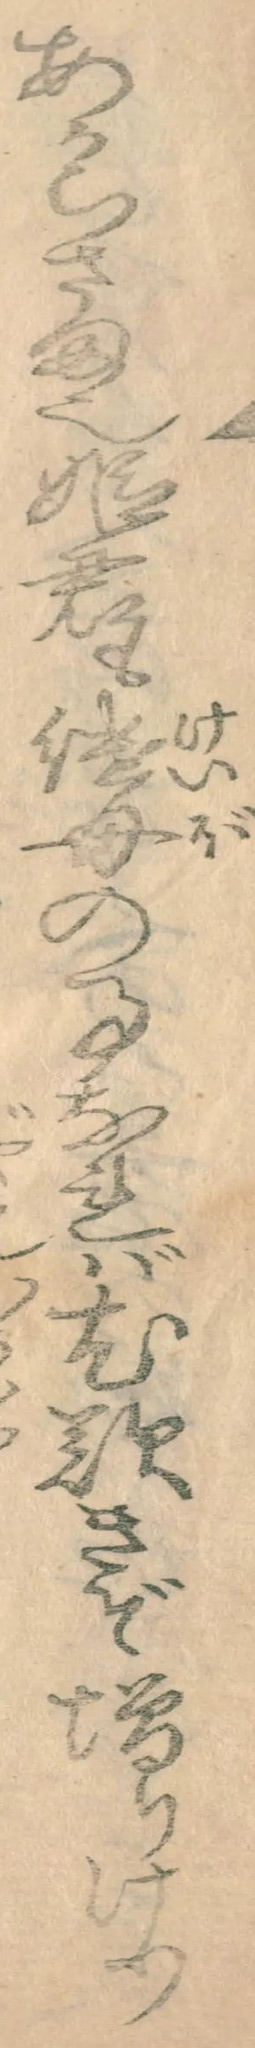あからさま也姫君も継母の事なれば尤歎きぞ増りけり
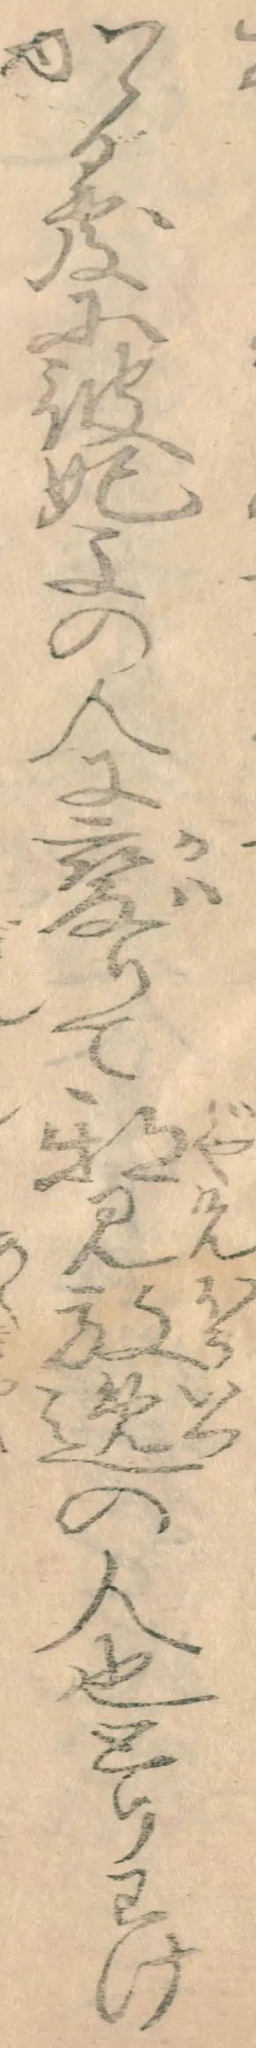かゝる處に彼妃よの人に変りて邪見放逸の人也とりわけ
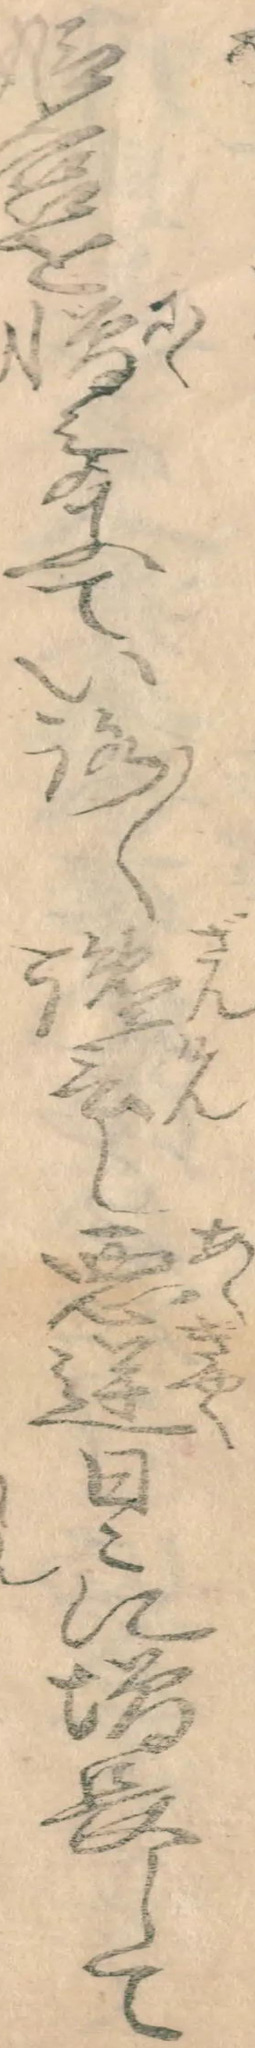姫宮を憎み給ふていろ〳〵讒言し悪逆日々に増長して
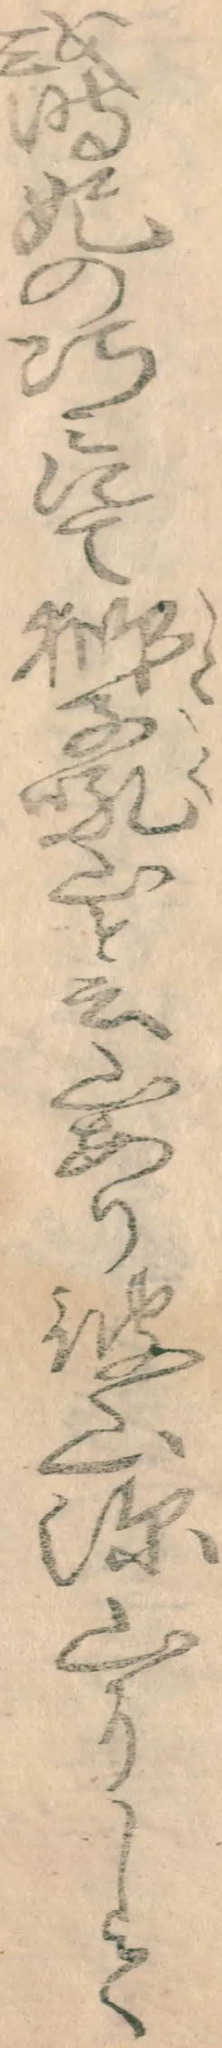或時妃の巧みにて獅子吼山と云山あり彼山深山にして
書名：蚕養御由来記
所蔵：国立国会図書館 National Diet Library, JAPAN
